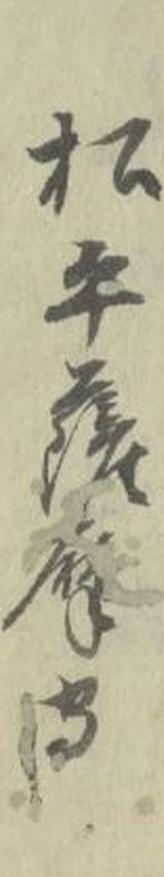松平薩摩守
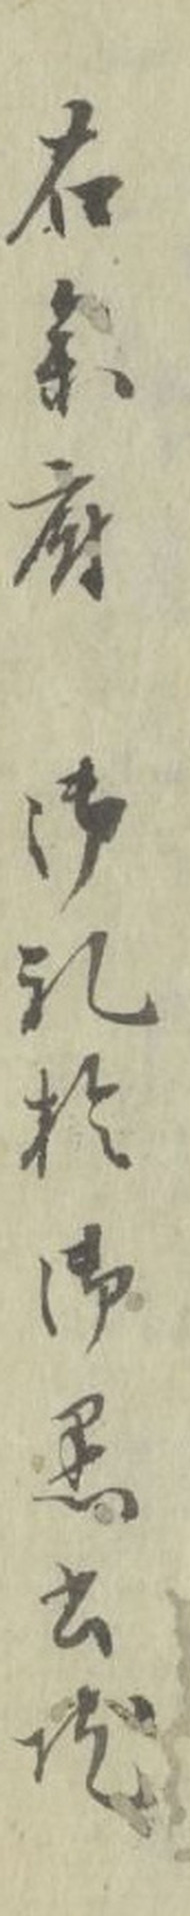右参府御礼於御黒書院
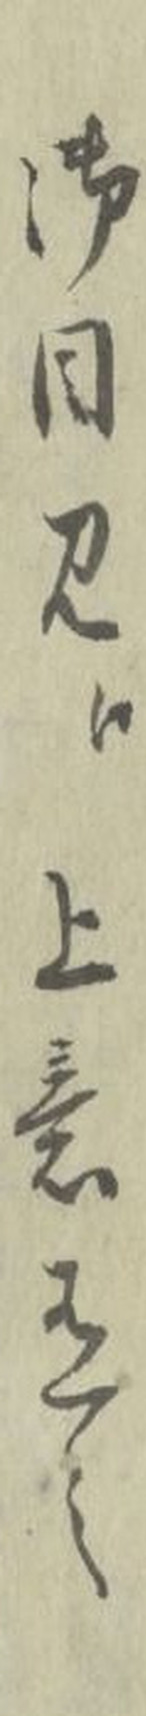御目見え上意有之

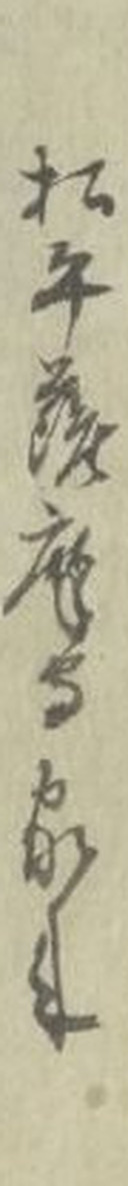松平薩摩守家来
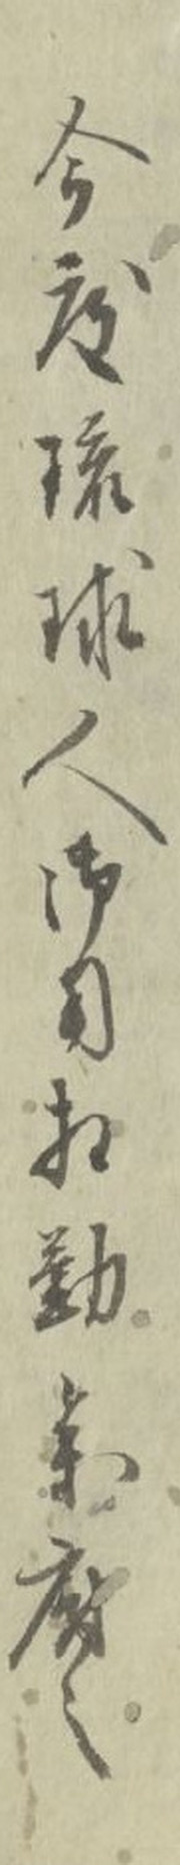今度琉球人御用相勤参府之
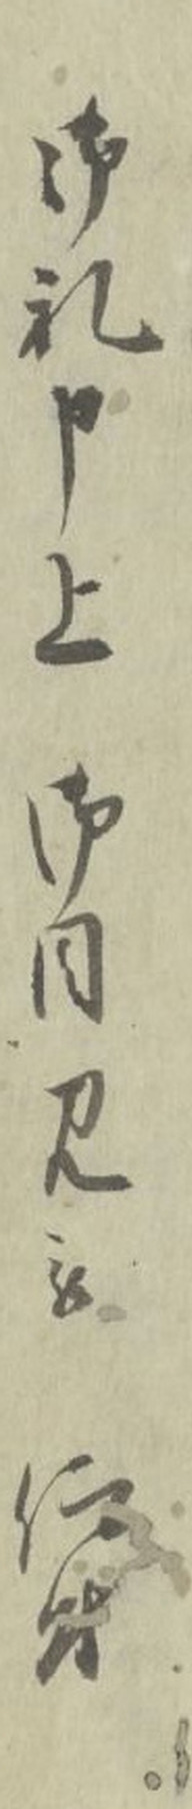御礼申上御目見被仰付
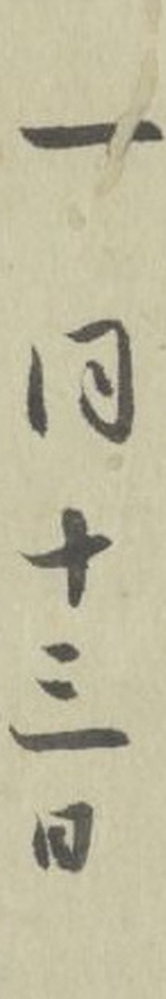一同十三日
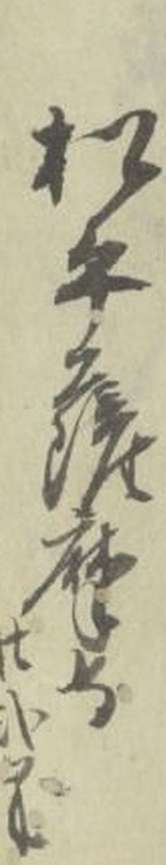松平薩摩守
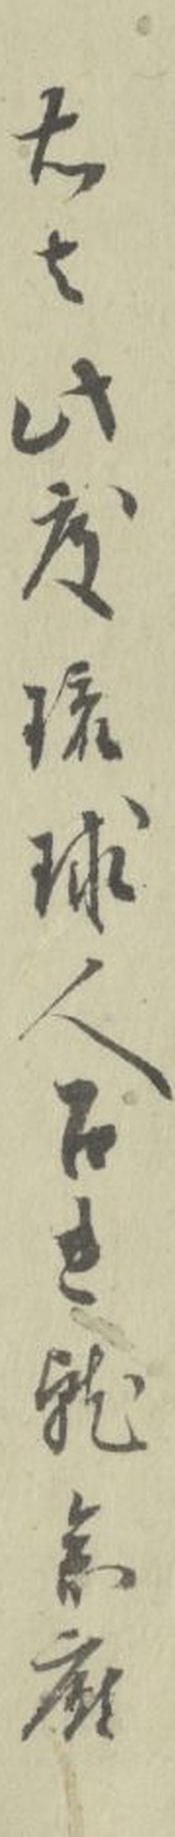右は此度琉球人召連就参府
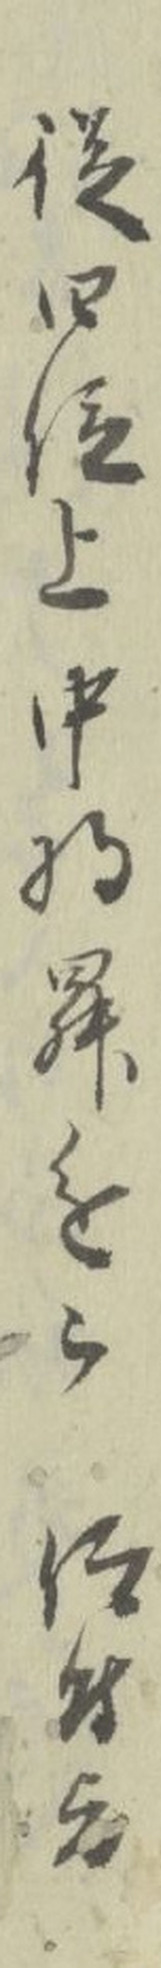従四位上中将昇進被仰付旨
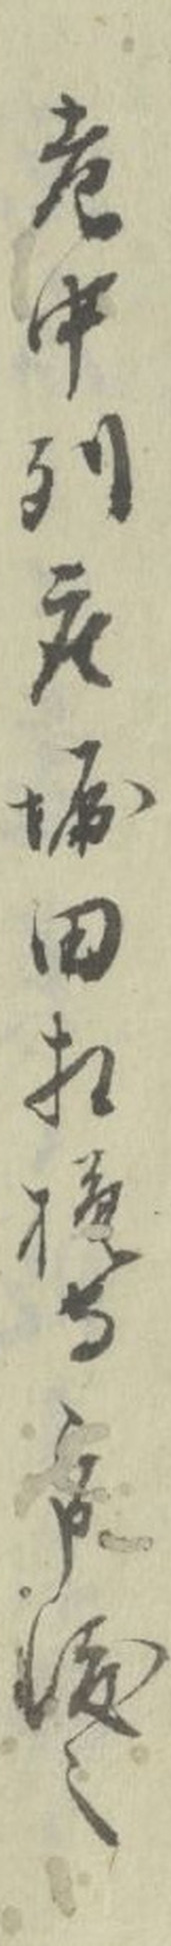老中列座堀田相模守被申渡之
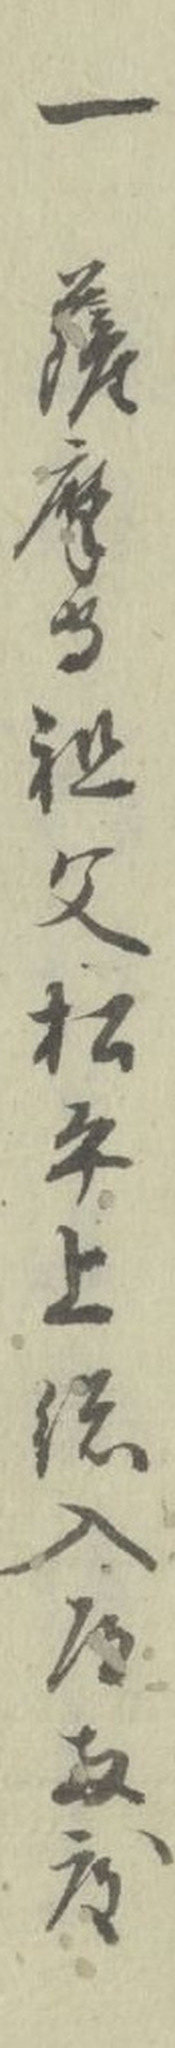一薩摩守祖父松平上総入道両度
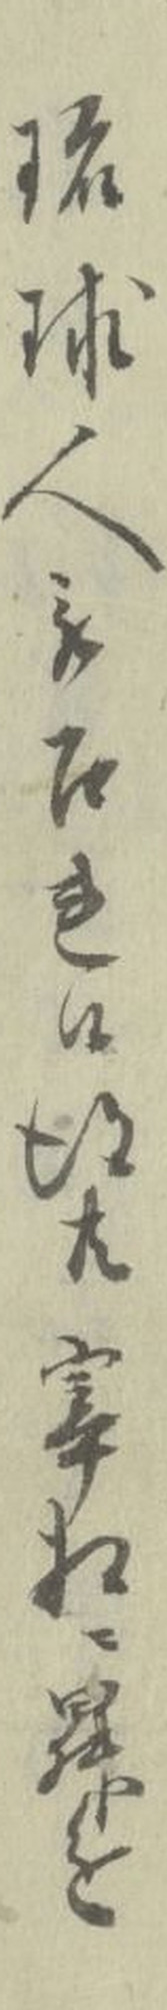琉球人被召連候得共宰相に昇進

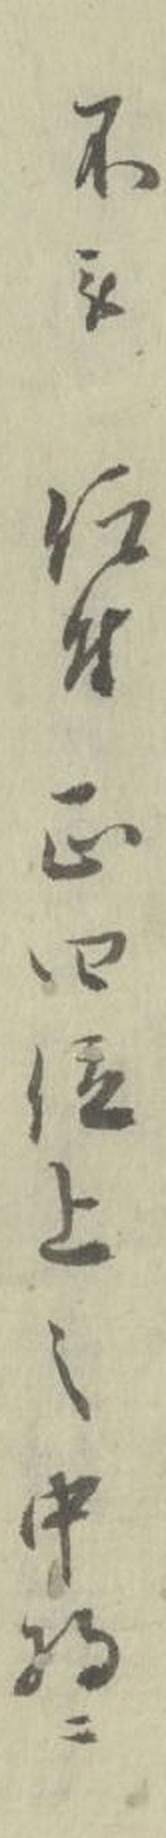不被仰付正四位上之中将に
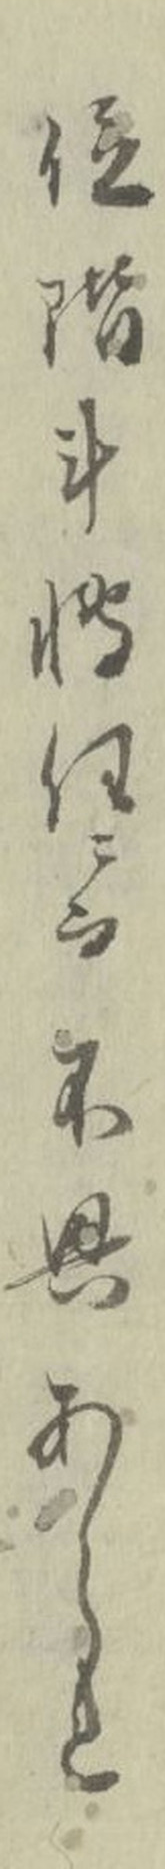位階計転任に而不興あられ
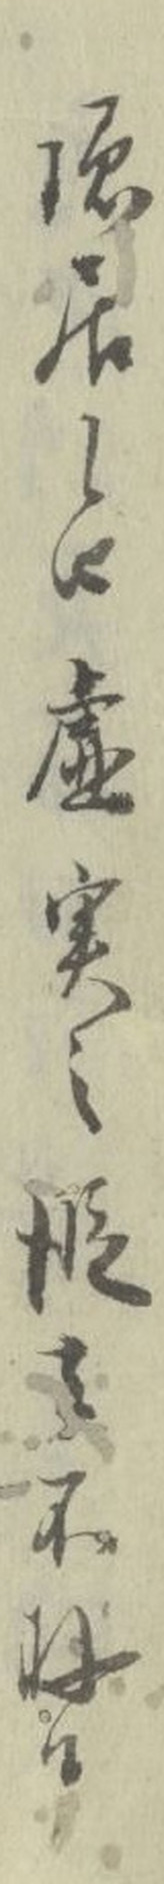隠居之由虚実之段は不詳候
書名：琉球来朝記 自一至七
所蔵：University of the Ryukyus Library
